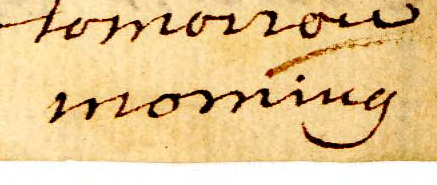morning
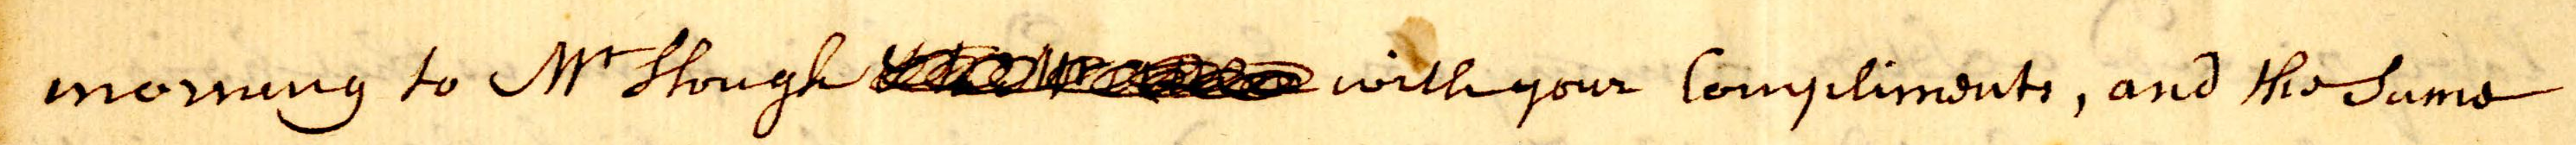morning to M^r Shugh [__________] with your Compliments, and the Same
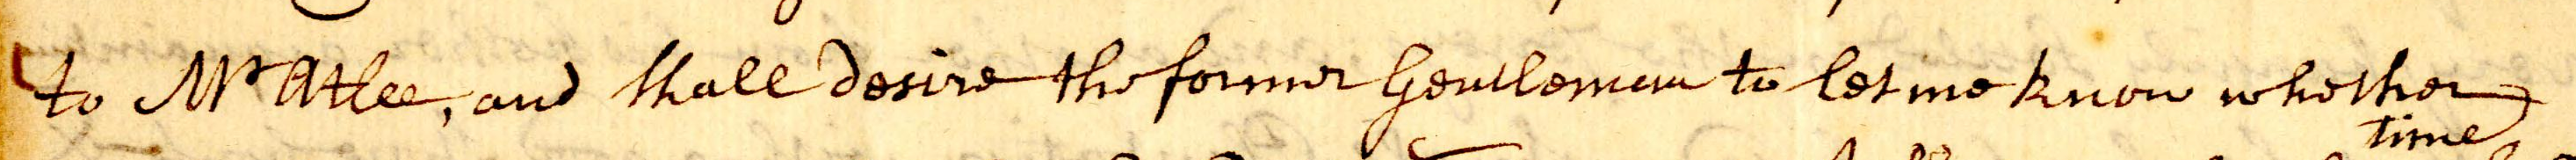to M^r Atlee, and shall desire the former Gentleman to let know whether
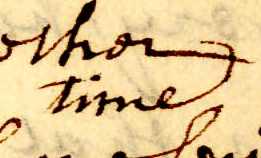time
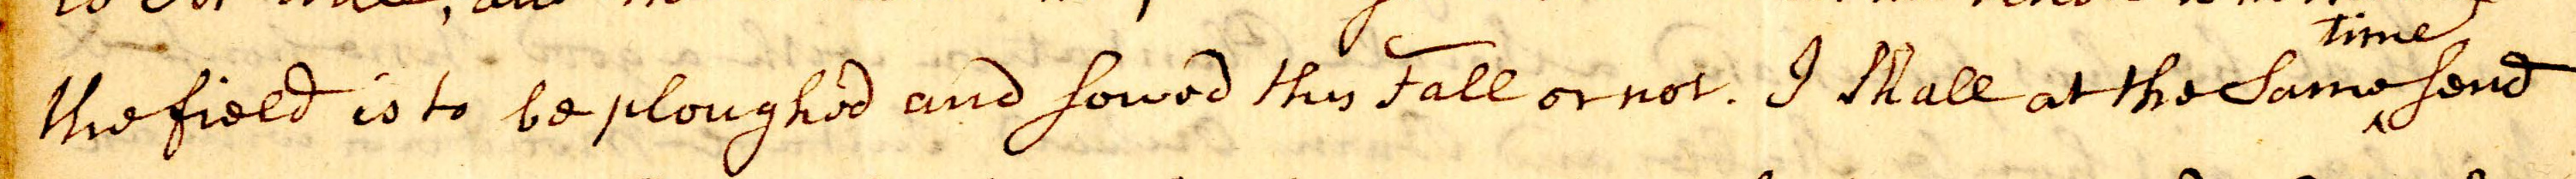the field is to be ploughed and Sowed this Fall or not. I Shall at the Same ^ send
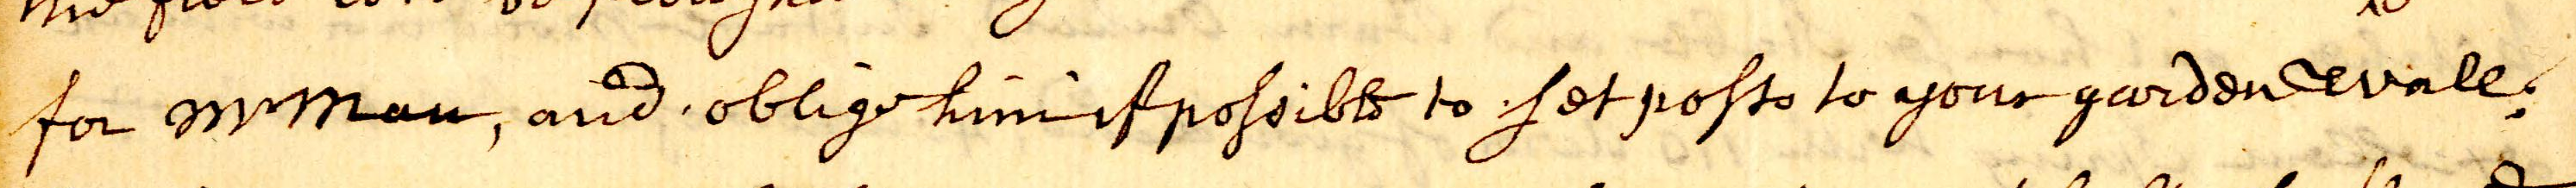for M^r Man, and oblige him if possible to set posts to your garden Wall.
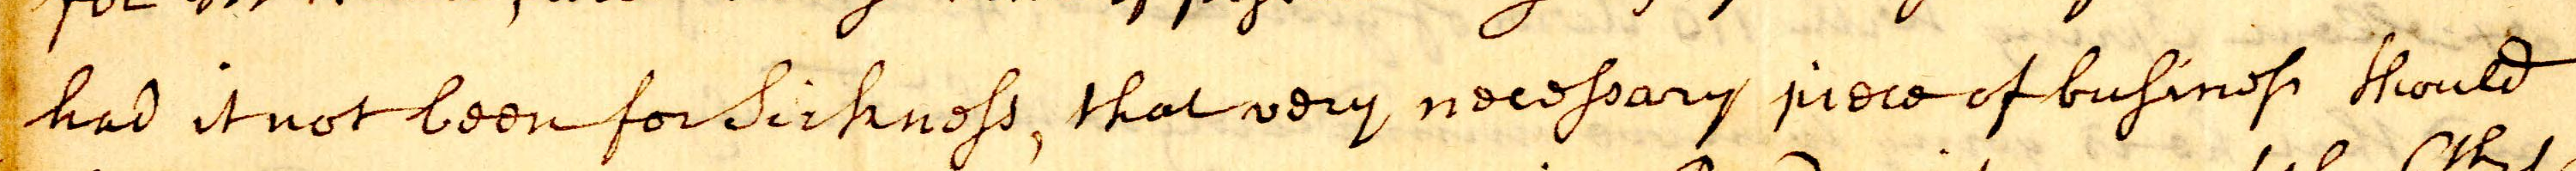had it not boon for Sickness, that very necessary piece of business should
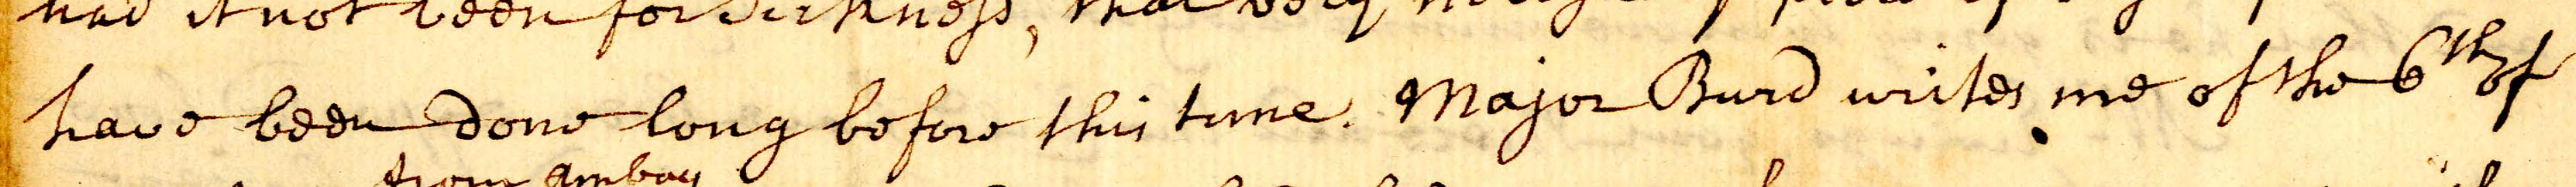have been done long before this time. Major Burd writes me of the 6^th of
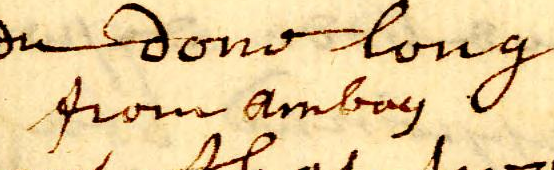from Amboy
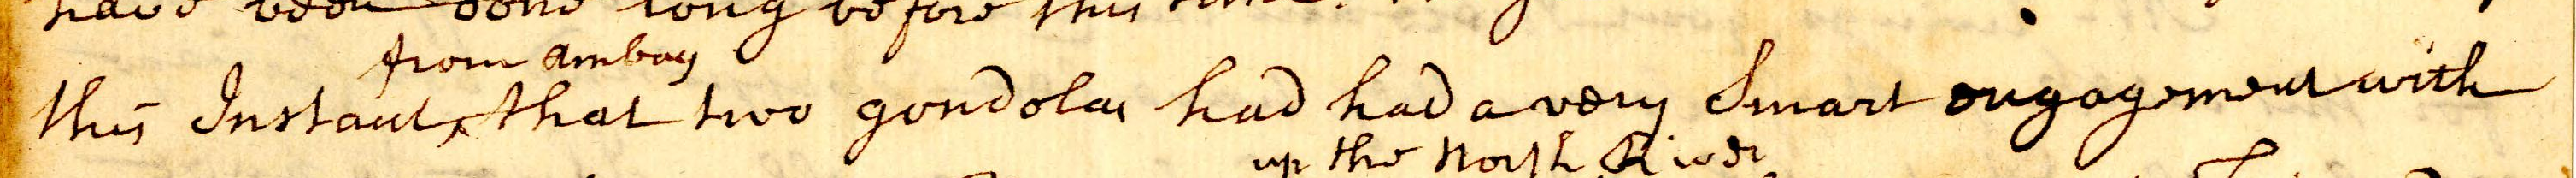this Instant ^ that two gondolas had had a very Smart engagement with
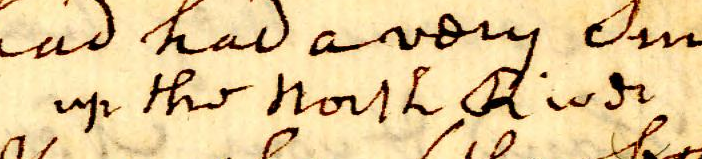up the North River
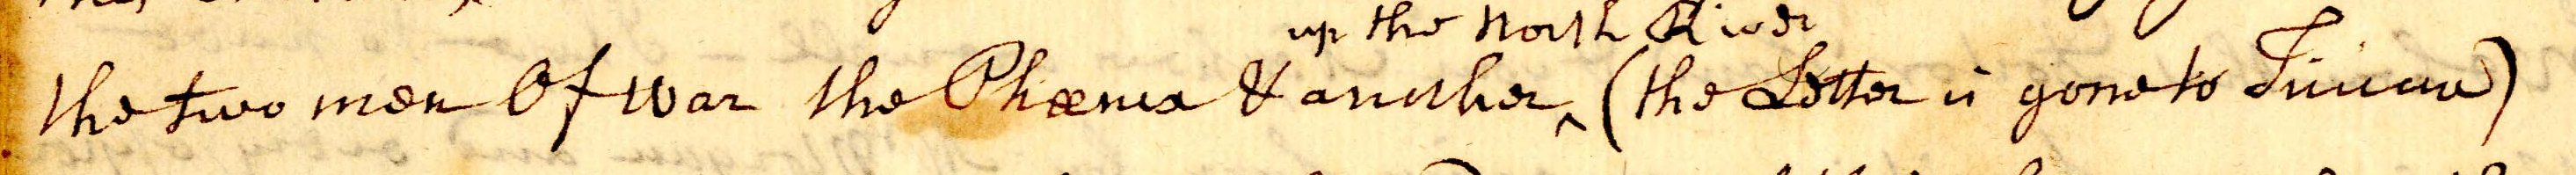the two men of war the Phoenix & another ^ (the Latter is gone to Tinian)
